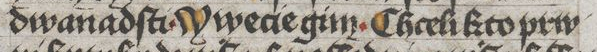dwanadſtí.Y wecie gim.Chceli kto prw¬
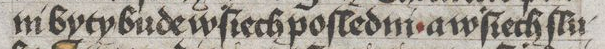ní byty bude wẛiech poſlední.a wẛiech ſlu¬
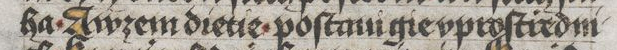ha.A wzem díetie.poſtaui gíe vproſtṙední¬
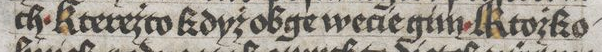ch.Ktereżto kdyż obge wecíe gím.Ktotoż ko¬
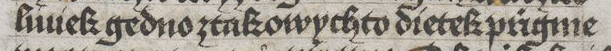liuiek gedno ztakowychto díetek pṙigme
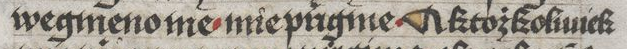wegmeno me.mie přigme.A ktożkoliuiek
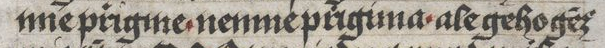mie pṙigme.ne mnie pṙigma.ale geho gēż
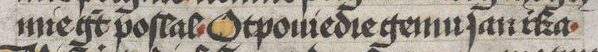míe ḡt poſlal.Otpouiedíe gemu Ian ṙka.
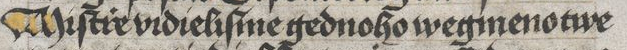Míſtṙe vidieli ſme gednoho wegmeno twe
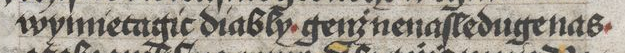wymíetaigíc diably.genż nenaſleduge nas.
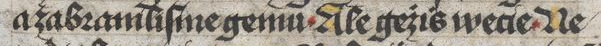a żabariliẛnie gemu.Ale geżiṡ wecie. Ne¬
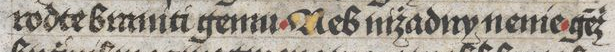rodte braniti gemu. Neb niżadny neníe gēż
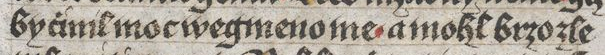by ċinil moc we gmeno me.a mohl brzo zle
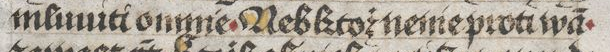mluuiti onmíe.Neb ktoż neníe proti wā.
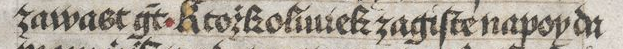zawast ḡt.Ktožkoluiek zagiſté napoy da¬
